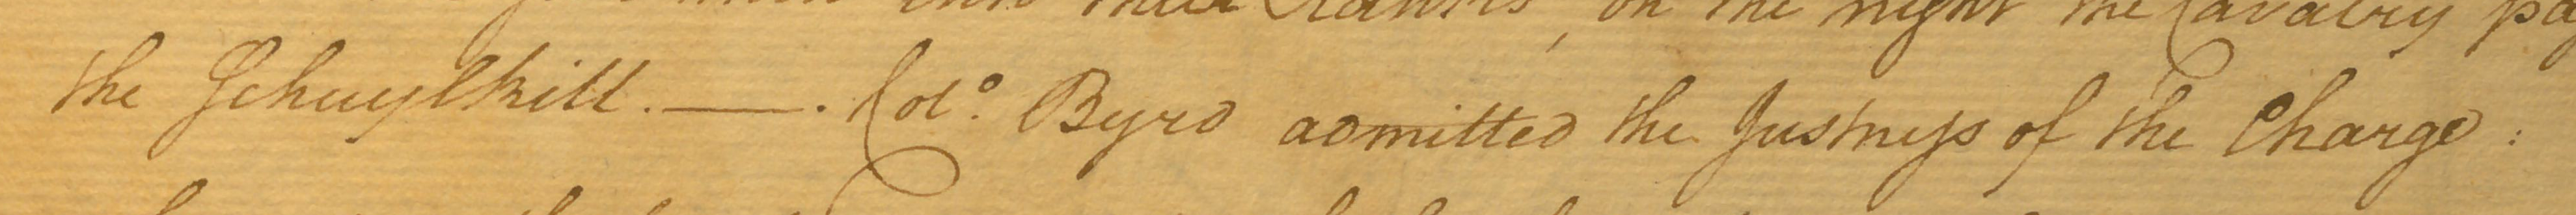the Schuylkill.-. Col^o. Byrd admitted the Justness of the Charge:
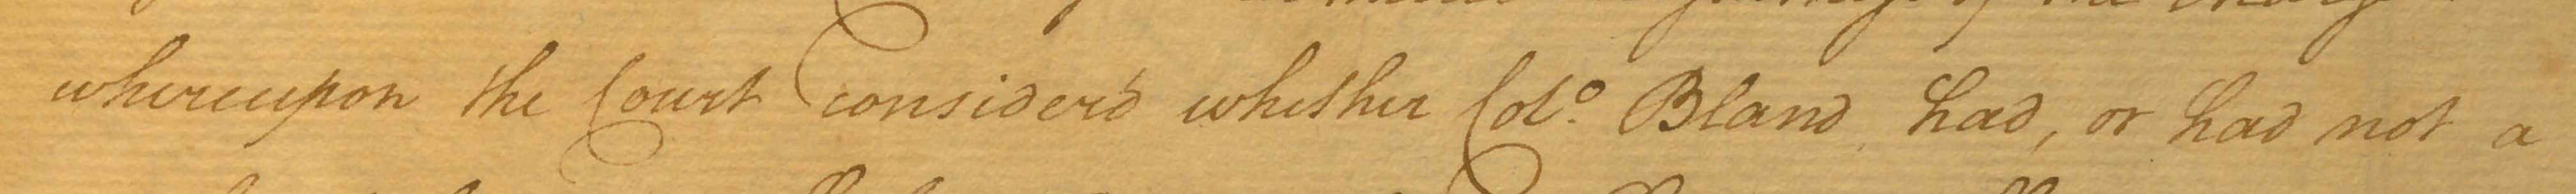whereupon the Court consider'd whether Col^o. Bland had, or had not a
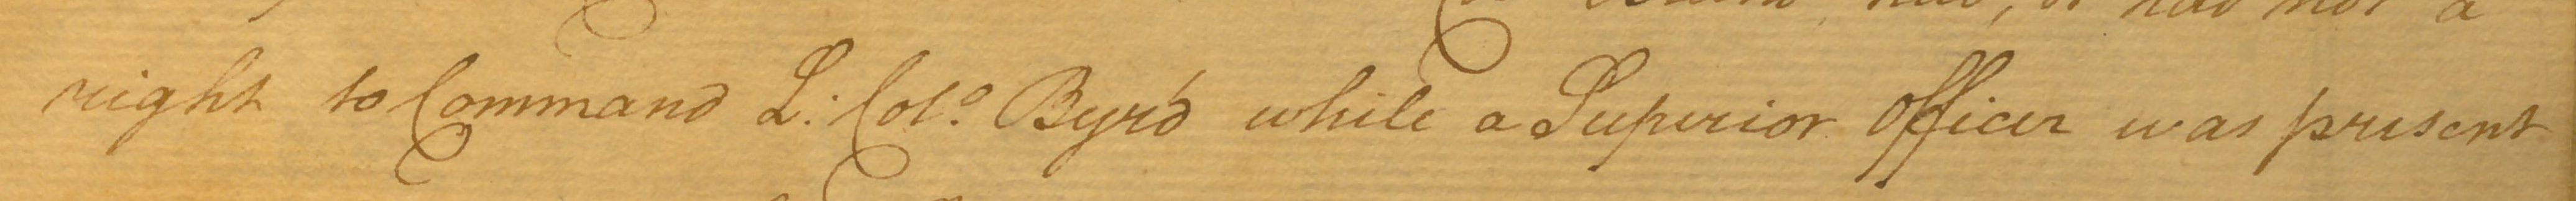right to Command L: Col^o. Byrd while a Superior officer was present
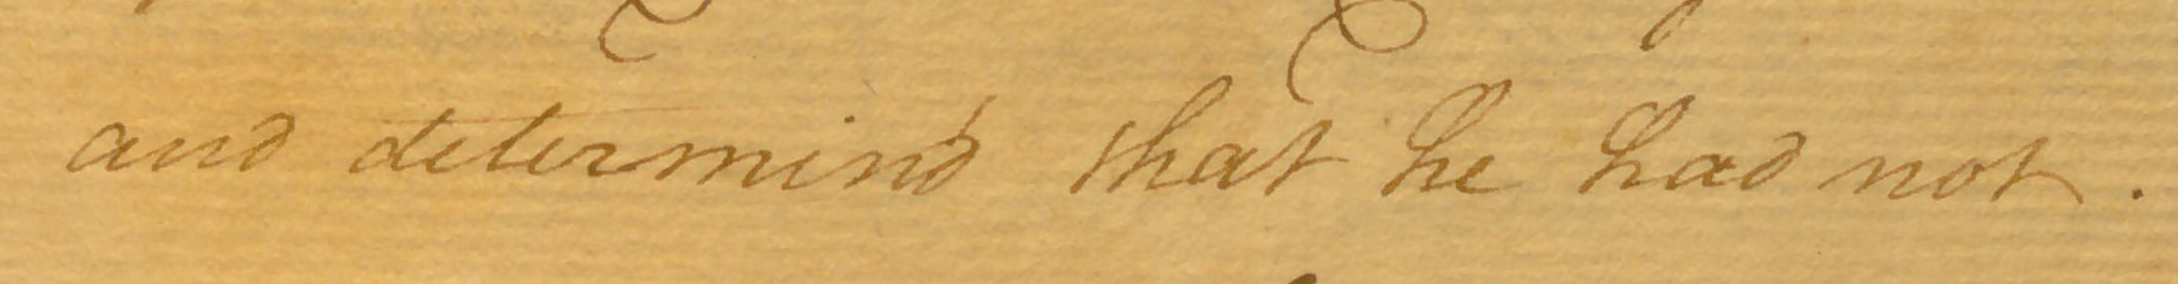and determin'd that he had not.
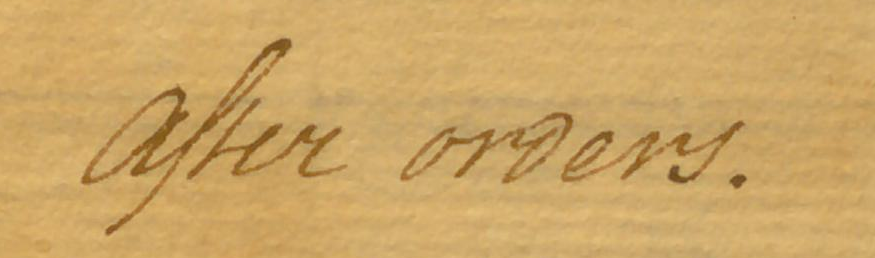After orders.
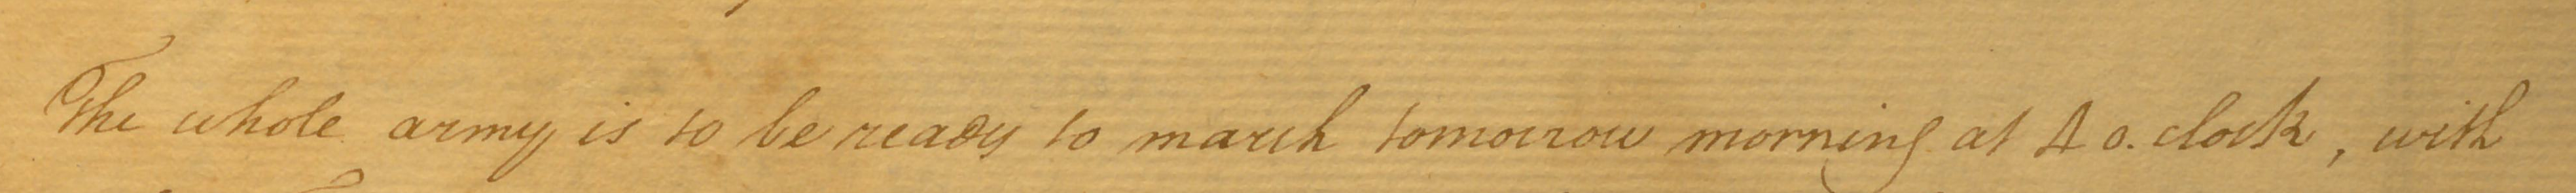The whole army is to be ready to march tomorrow morning at 4 o.clock, with
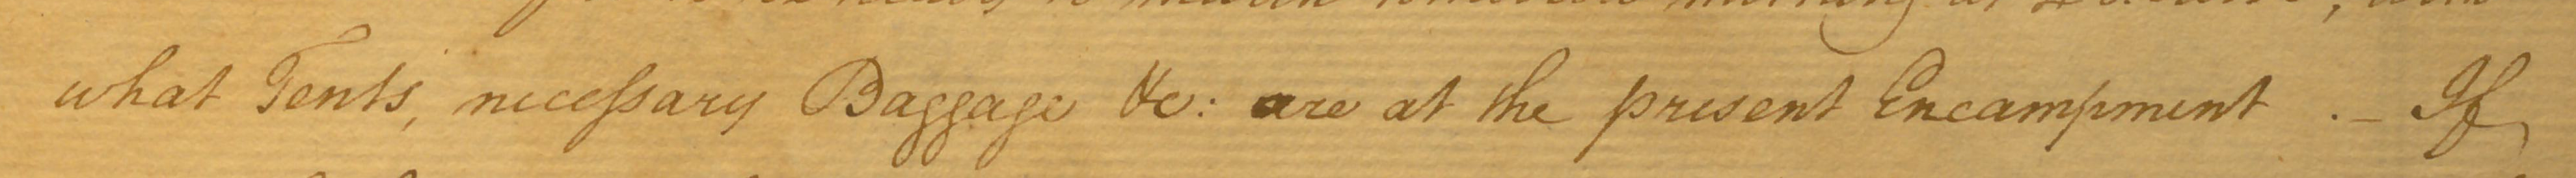what Tents, necessary Baggage &c: are at the present Encampment.- If
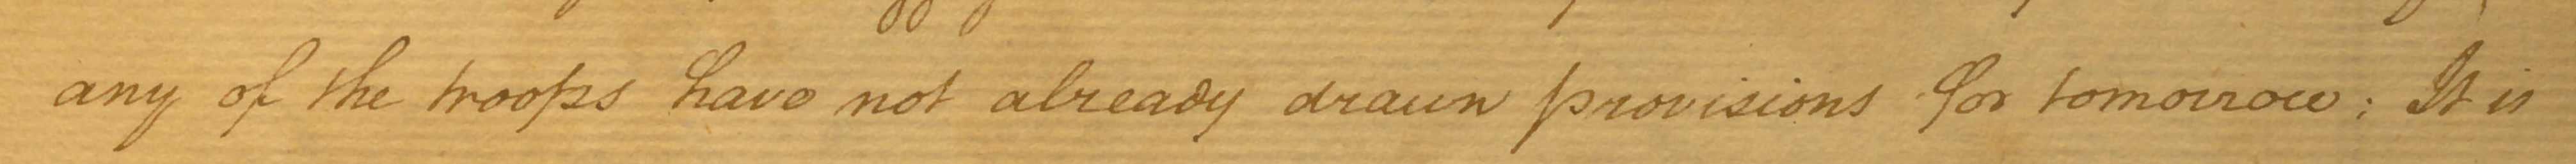any of the troops have not already drawn provisions for tomorrow; It is
